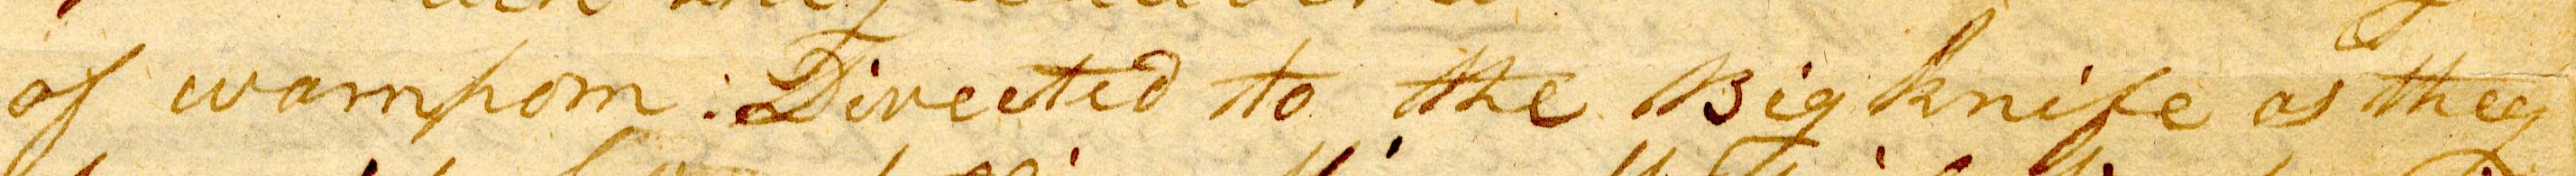of wampom: Directed to the Big knife as they
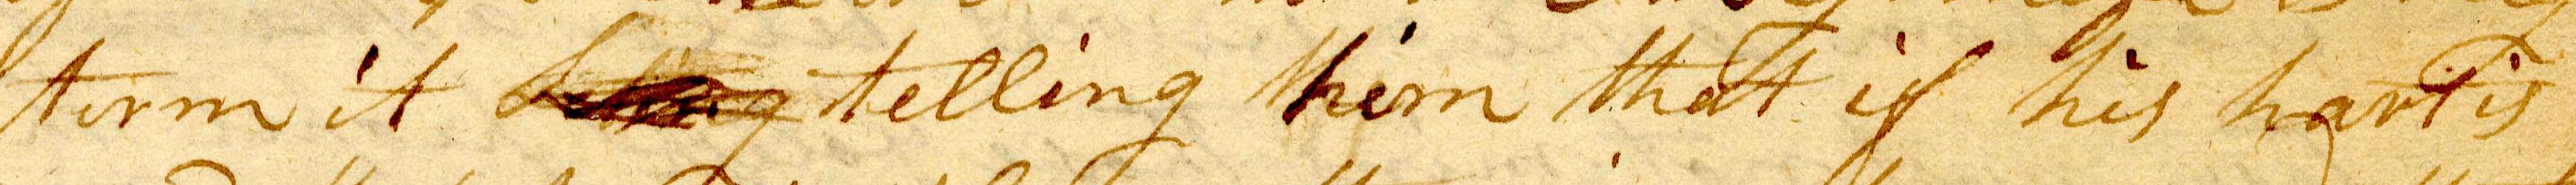term it [_____] telling him that if his hart is
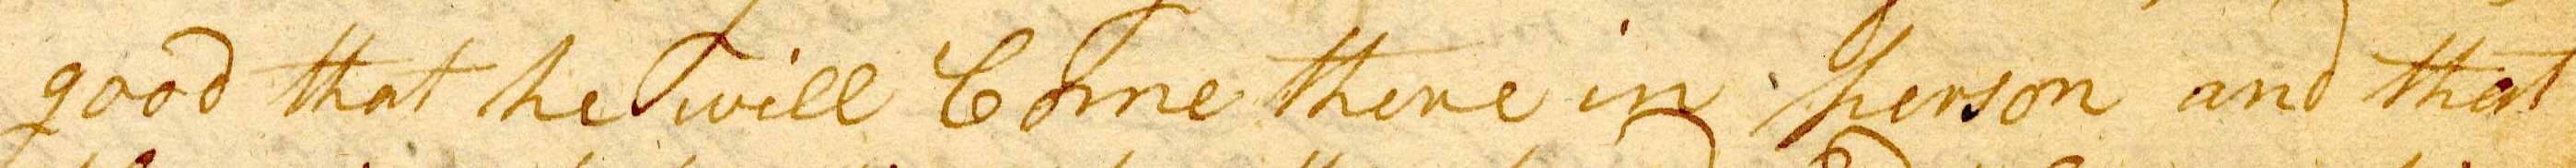good that he will Come there in person and that
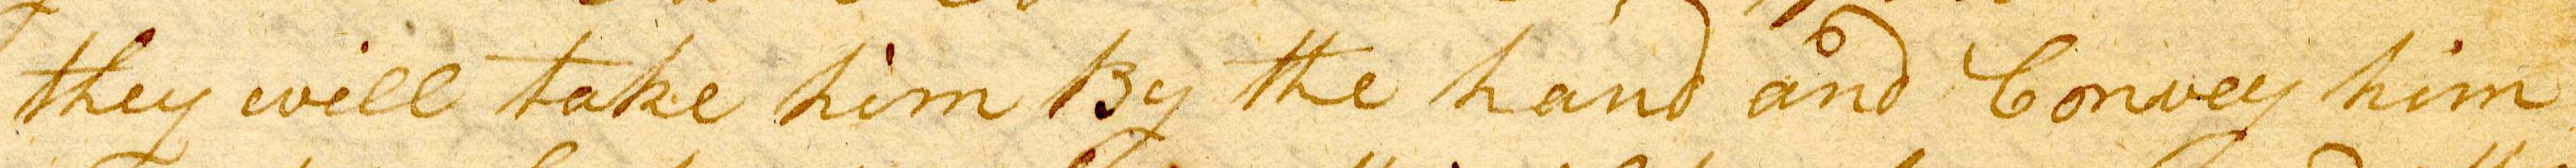they will take him By the hand and Convey him
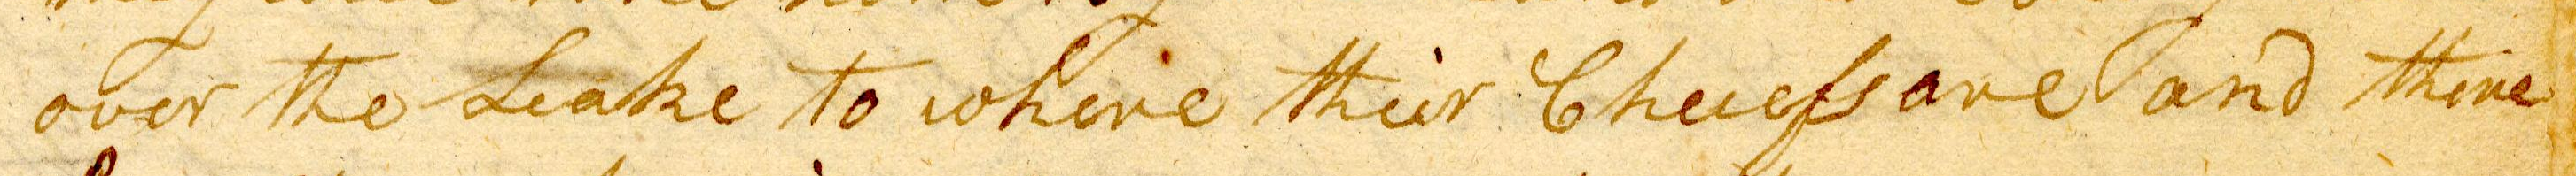over the Leake to where their Chiefs are and there
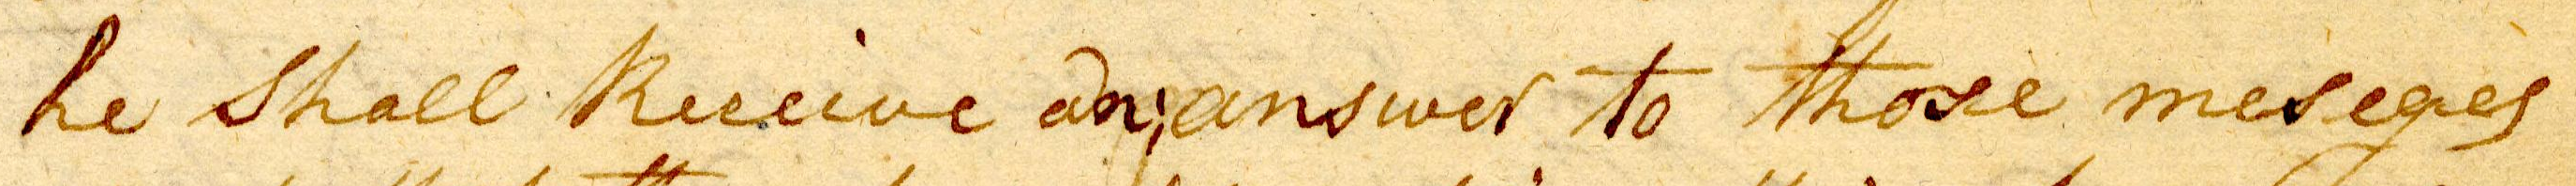he shall Receive an answer to those meseges
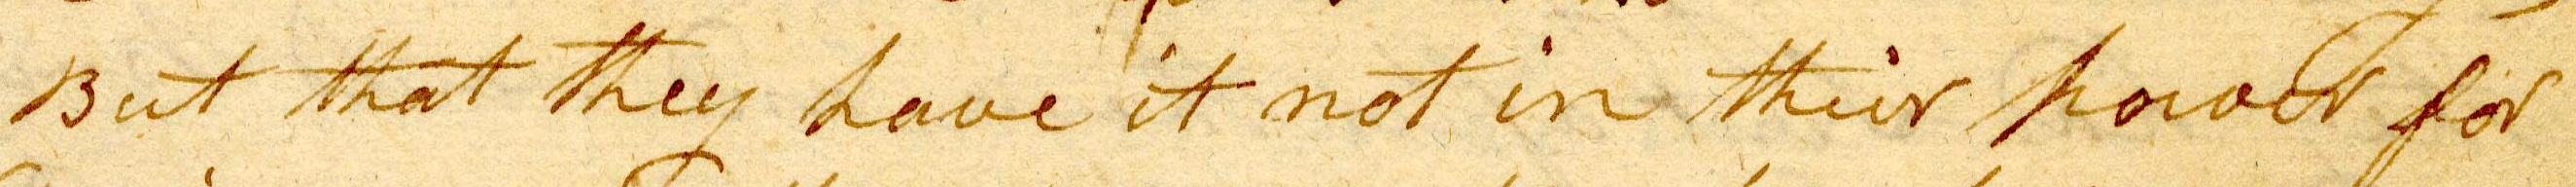But that they have it not in their power for
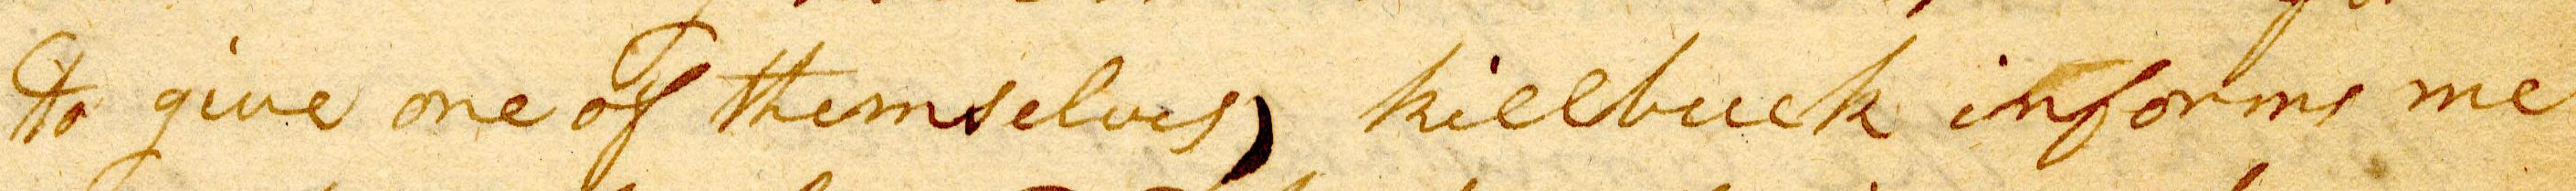to give one of themselves, Killbuck informs me
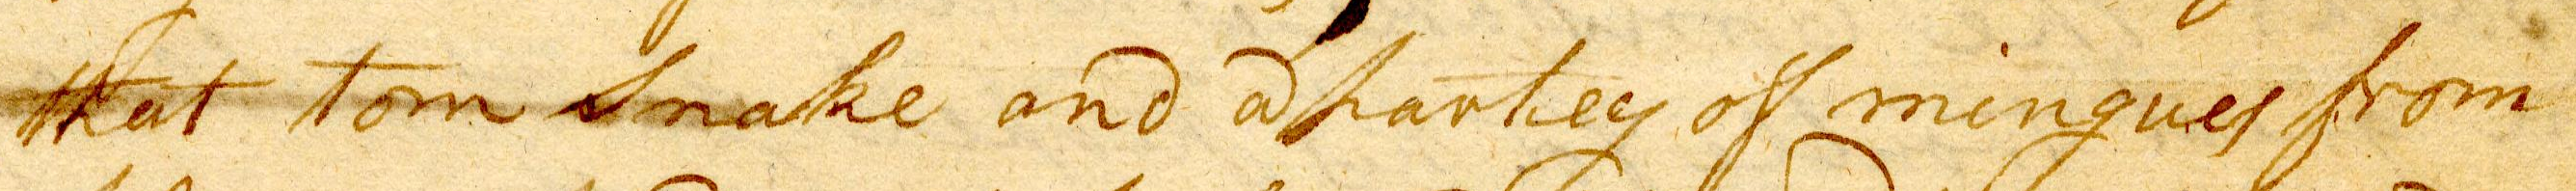that tom Snake and a partey of mingues from
